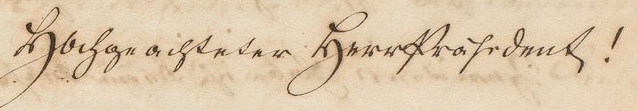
Hochgeachteter Herr Präsident!
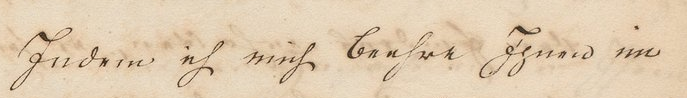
Indem ich mich beehre Ihnen im
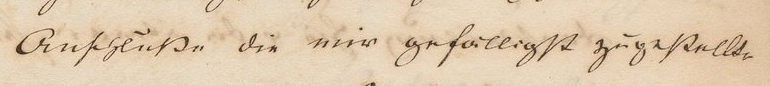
Anschluße die mir gefälligst zugestellte
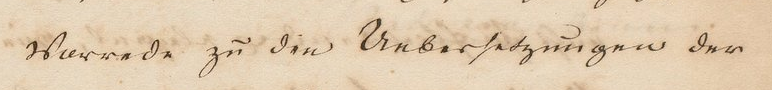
Vorrede zu den Uebersetzungen der
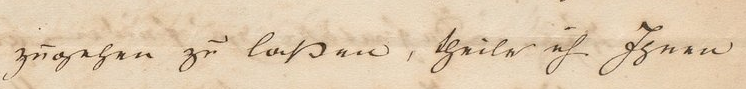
zugehen zu laßen, theile ich Ihnen
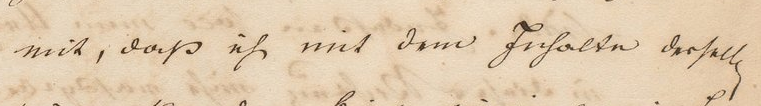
mit, daß ich mit dem Inhalte derselben
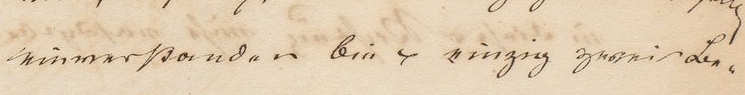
einverstanden bin & einzig zwei Be-
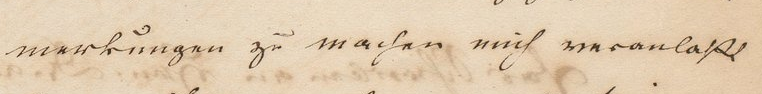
merkungen zu machen mich veranlaßt
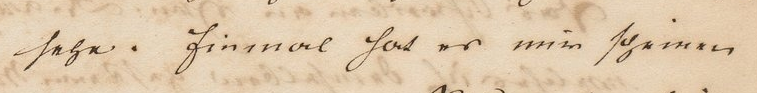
sehe. Einmal hat es mir scheinen
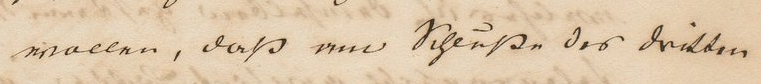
wollen, daß am Schluße des dritten
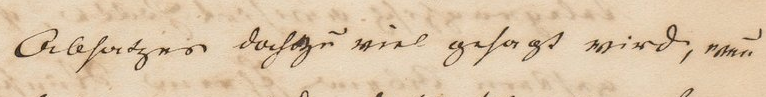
Absatzes doch zu viel gesagt wird, wenn
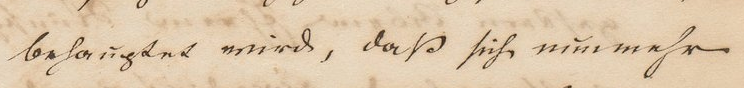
behauptet wird, daß sich nunmehr
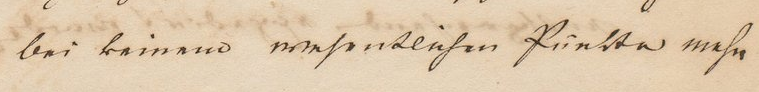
bei keinem wesentlichen Punkte mehr
